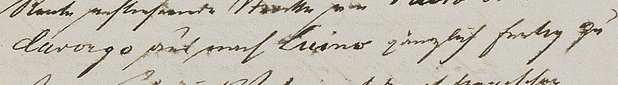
Lavorgo aus nach Luino gänzlich fertig zu
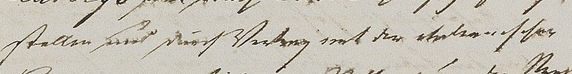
stellen und durch Vertrag mit der italienischen
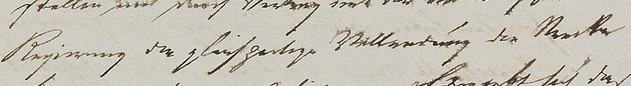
Regierung die gleichzeitige Vollendung der Strecke
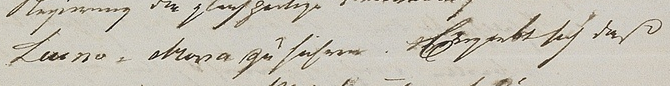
Luino– Arona zu sichern. Ergiebt sich daß
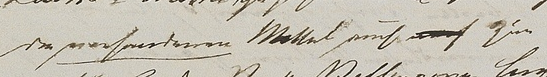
die vorhandenen Mittel auch zur
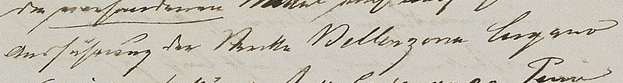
Ausführung der Strecke BellinzonaLugano
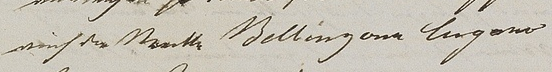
auch die Strecke BellinzonaLugano
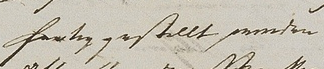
fertig gestellt werden.
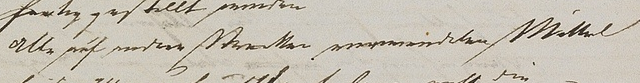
Alle auf andere Strecken verwendeten Mittel
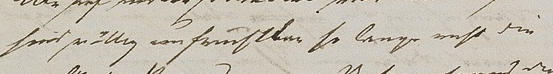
sind völlig unfruchtbar so lange nicht die
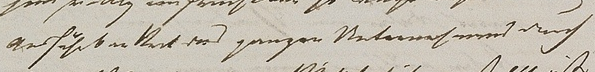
Ausführbarkeit des ganzen Unternehmens durch
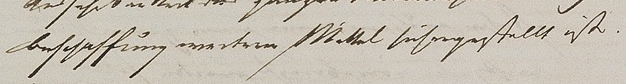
Beschaffung weiterer Mittel sichergestellt ist.
